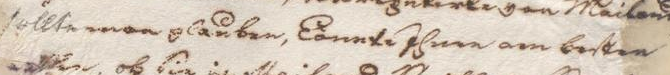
sollte man glauben, könnte Ihnen am besten
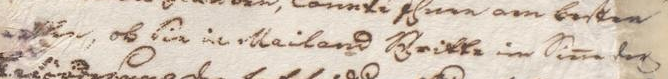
rathen, ob Sie in Mailand Schritte im Sinne der
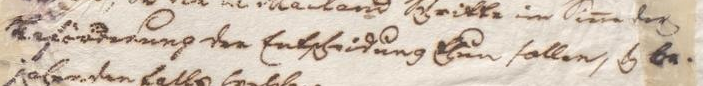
Beförderung der Entscheidung thun sollen, & be-
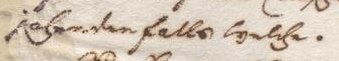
jahendenfalls welche.
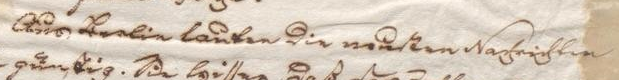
Aus Berlin lauten die neusten Nachrichten
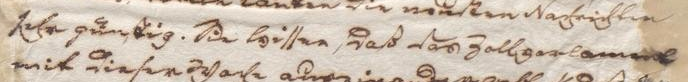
sehr günstig. Sie wissen, daß das Zollparlament
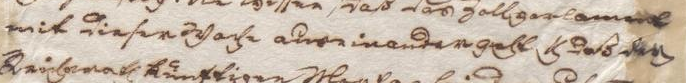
mit dieser Wache auseinandergeht & daß der
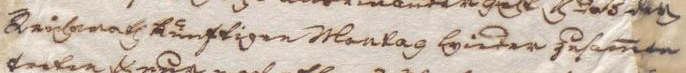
Reichsrath künftigen Montag wieder zusammen-
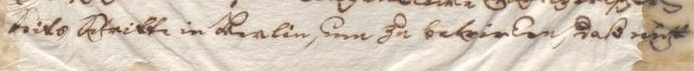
Seits Schritte in Berlin, um zu bewirken, daß nicht
